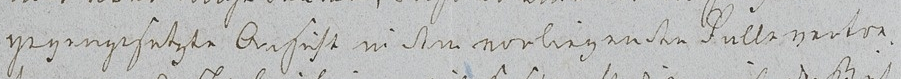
gegengesetzte Ansicht in dem vorliegenden Falle vertre-
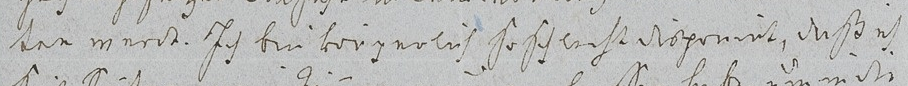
ten werde. Ich bin körperlich so schlecht disponirt, daß ich
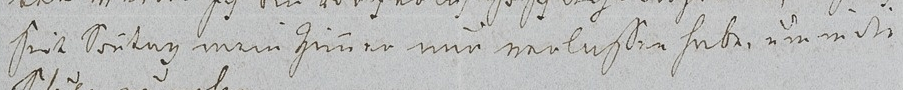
seit Sonntag mein Zimmer nur verlassen habe, um in die
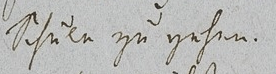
Schule zu gehen.
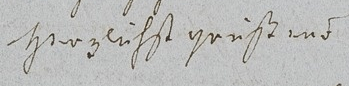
Herzlichst grüßend
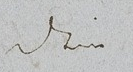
Dein
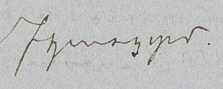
J Honegger.
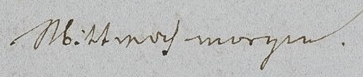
Mittwoch morgen.
